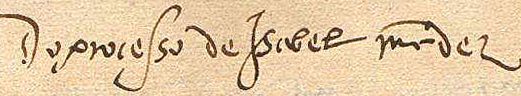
Do processo de Jsabel mēdez
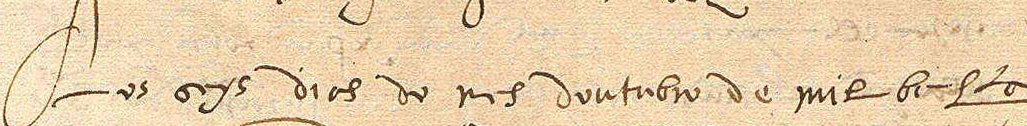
Aos seys dias do mes doutubro de mil bc Lta
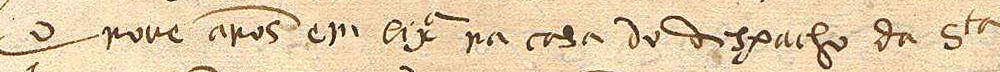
e noue an̄os em lixa na casa de despacho da Sta
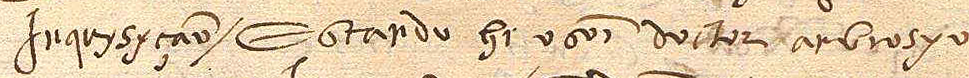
Jnquysyção / Estando hi o sōr doctor ambrosyo
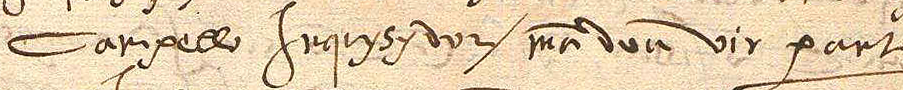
Campello Jnquysydor / m̄adou vir ꝑante
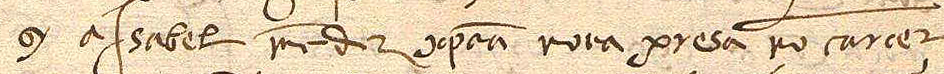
sy a Jsabel m̄edez xp̄aa noua presa no carcer
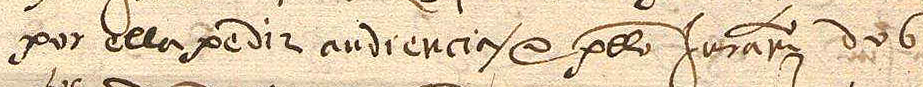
por ella pedir audiencia / e p̄llo Juramto dos
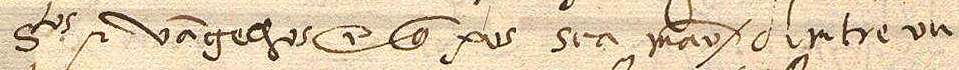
Stos evāgelhos ē q̄ pos sua mão / Amtre ou
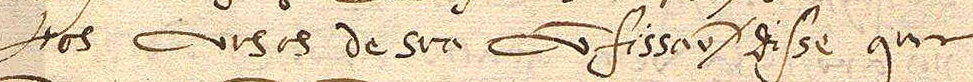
tras Cousas de sua Cōfissaõ / disse que
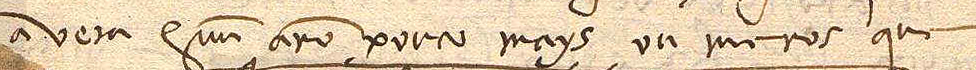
avera hūu an̄o pouco mays ou menos que
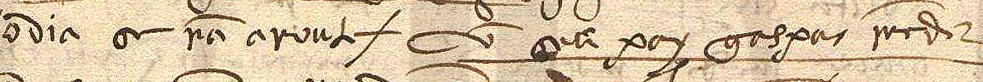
o dia senā a noute / Cō seu pay gaspar m̄edez
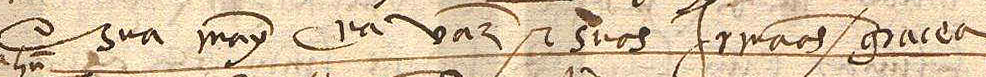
e sua mãāy Cnv Vāz e suaJ Iāmãas / gracea
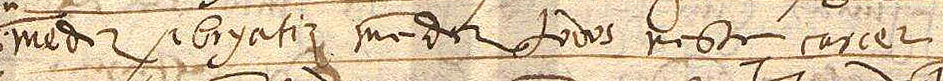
m̄edez e bryatiz m̄edez todos neste carcer
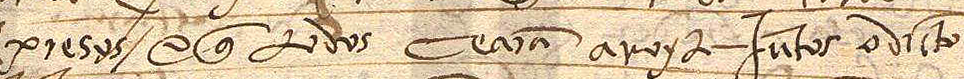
presos / e q̄ todos Cear̄a a noyte Jūtos o dic̄to
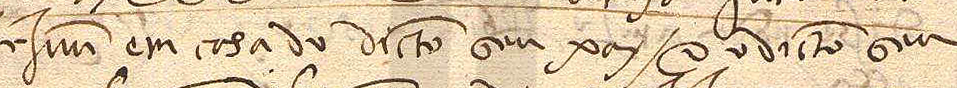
JeJūu em casa do dic̄to seu pay / e o dic̄to seu
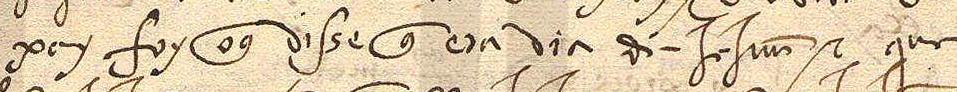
pay foy o q̄ dise q̄ era dia de JeJuū e que
